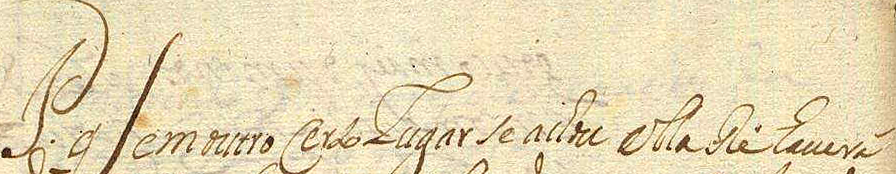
P. q̄ em outro Certo Lugar se achou ella Re hauerá
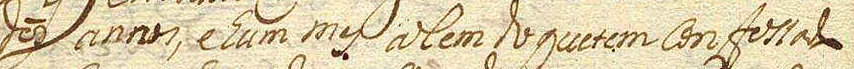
dez annos, e hum mes alem do que tem confessado
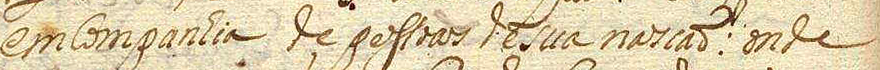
em Companhia de pessoas de sua nasçaõ: onde
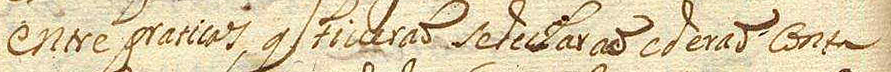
entre praticas, q̄ tiueraõ se declaraõ e deraõ Conta
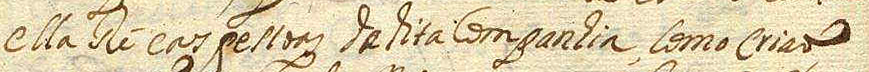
ella Ré, e as pessoas da dita Companhia, Como Criaõ,
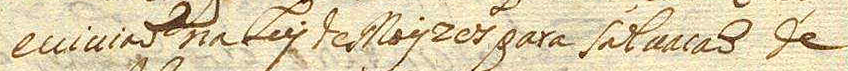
e uiuiaõ na Ley de Moyzes para saluaçaõ de
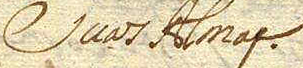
suas Almas.
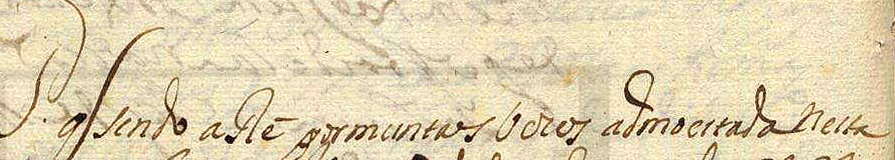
P. q̄ sendo a Ré por muntas vezes admoestada nesta
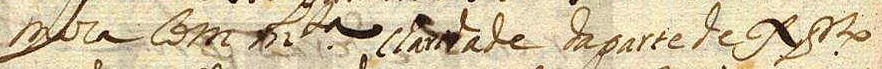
meza com m.ta charidade da parte de xp.to
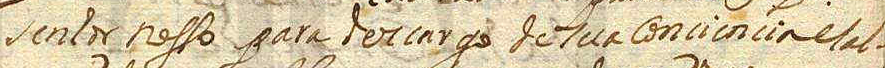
senhor nosso para descargo de sua conciencia e sal
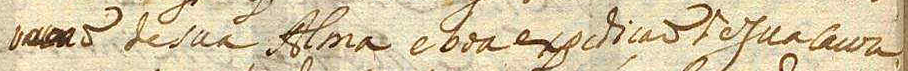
vaçaõ de sua Alma, e boa expediçaõ de sua cauza
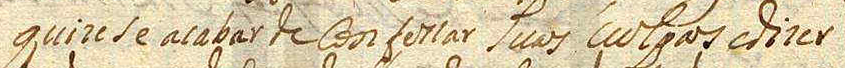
quizese acabar de Confessar suas culpas e dizer
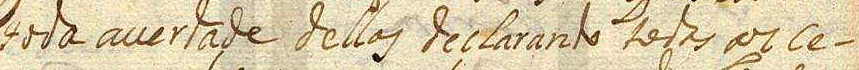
toda a uerdade dellas declarando todas as ce
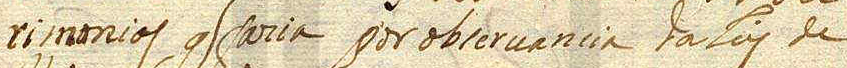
rimonias q̄ fazia por obseruancia da Ley de
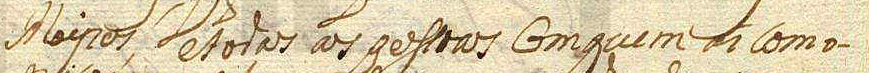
Moyzes, e todas as pessoas com quem as como
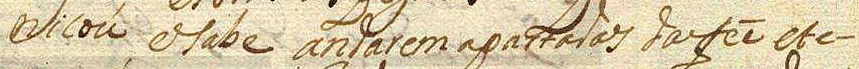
nicou e sabe andarem apartadas da fée e te
